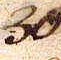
30
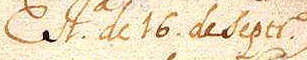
Est.a de 16. de septr.o
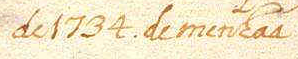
de 1734 de menhaã
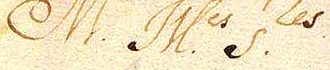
M.to Ill.es s.Res
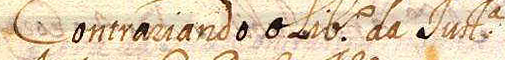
Contrariando o Lib.o da Iust.a
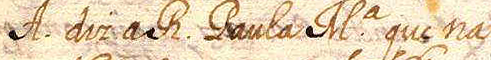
A. diz a R. Paula M.a que na
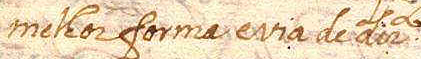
melhor forma e via de dir.to
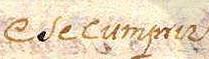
e se cumprir
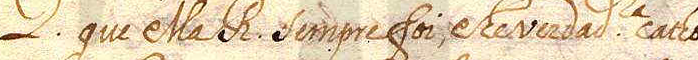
P. que ella R. sempre foi, e he verdad.ra catho
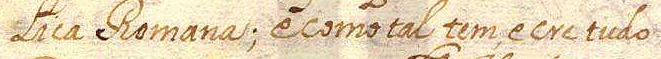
Lica Romana; e como tal tem, e cre tudo
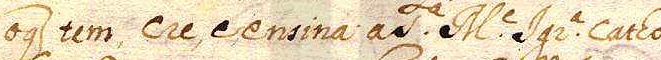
o q̄ tem, cre e ensina a s.ta M.e Igr.a catho
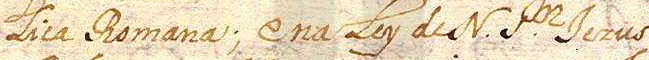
Lica Romana; e na Ley de N. s.or Iezus
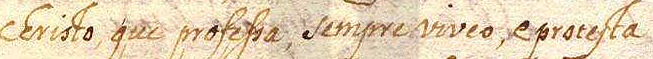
christo, que professa, sempre viveo, e protesta
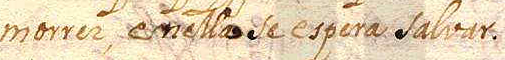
morrer, e nella se espera salvar.
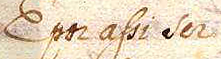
E por assi ser
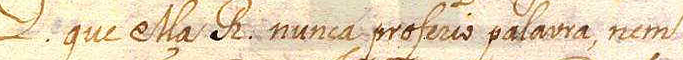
P. que ella R. nunca proferio palavra, nem
